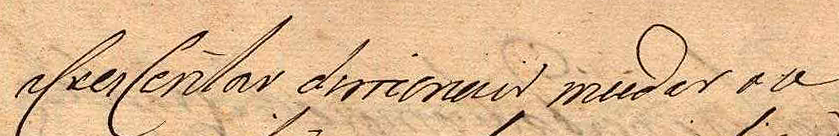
aCresCentar diminuir mudar ou
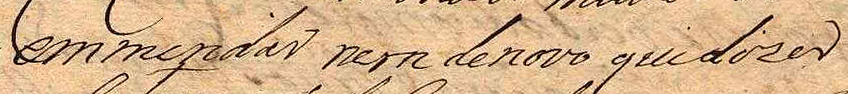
emmendar, nem de novo que dizer
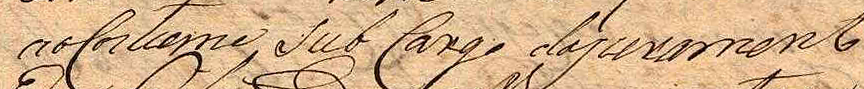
ao Costume, sub Cargo do juramento
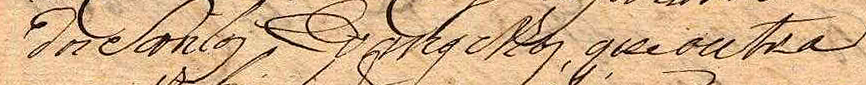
dos Santos Evangelhos, que outra
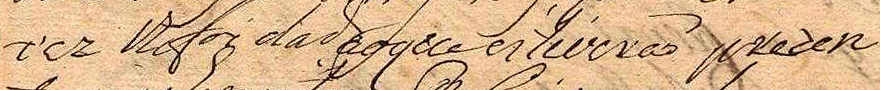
vez lhe foy dado ao que estiveraõ prezen
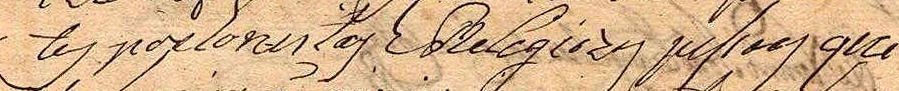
tes pos honestas, E Relegiozas pessoas que
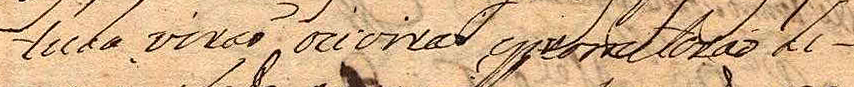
tudo viraõ ouviraõ, e prometeraõ di
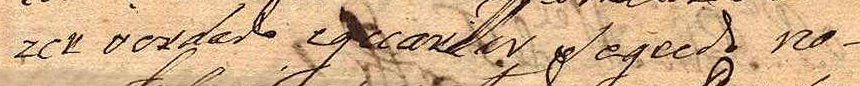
zer verdade e guardar segredo no
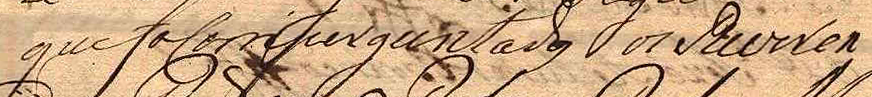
que foCem perguntados os Reveren
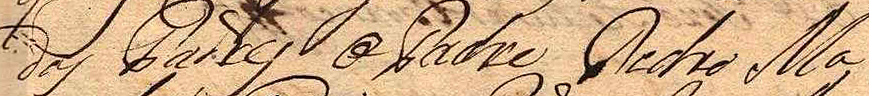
dos Padres o Padre Pedro Ma
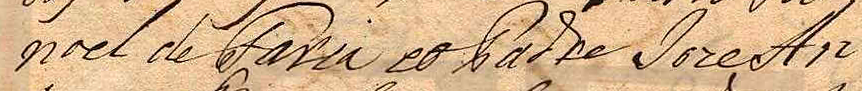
noel de Faria e o Padre Ioze An
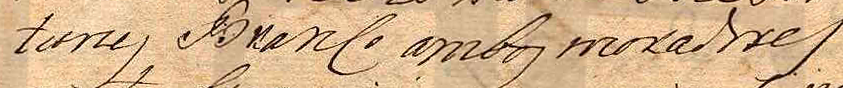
tunes BranCo ambos moradores
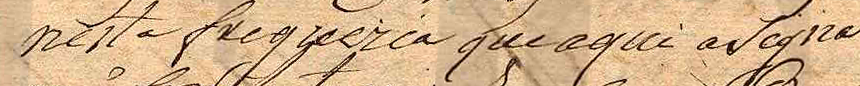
nesta freguezia que aqui asigna
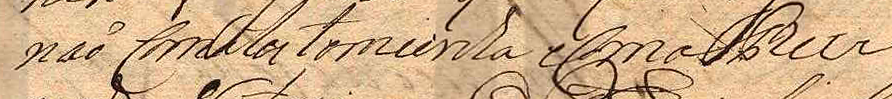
raõ Com a testemunha e Com o Reve
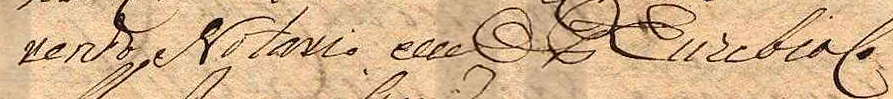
rendo Notario e eu O P Euzebio Co
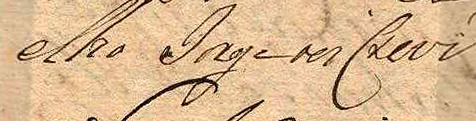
elho Iorge o esCrevi
